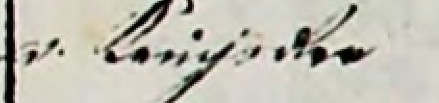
v. Keinjoder
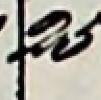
25
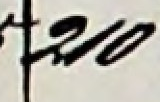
210
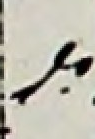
do
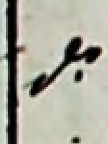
do
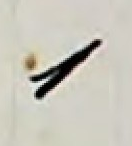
1
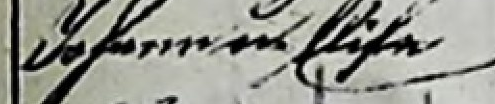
Johann u. Elisa
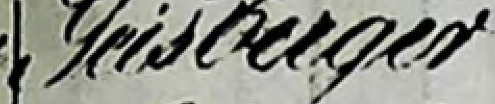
Geisberger
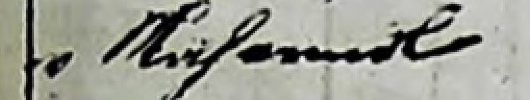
v. Mas???l
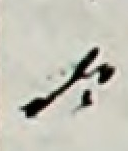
do
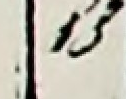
88
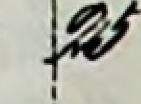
25
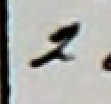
2
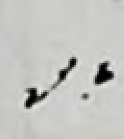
do
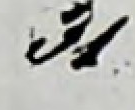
31
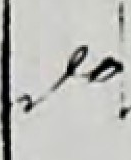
do
